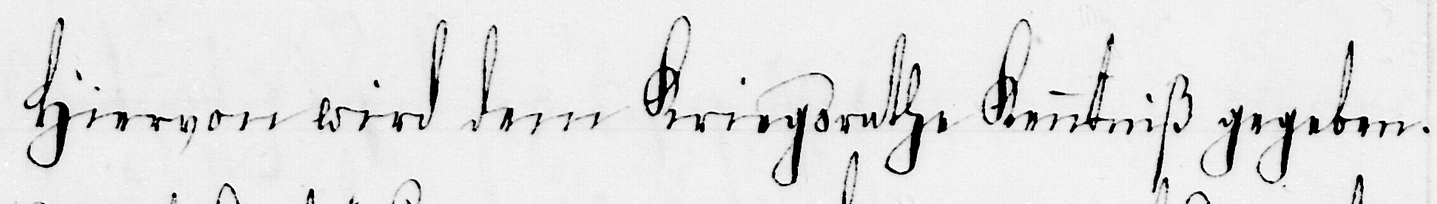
Hiervon wird dem Kriegsrathe Kenntniß gegeben.
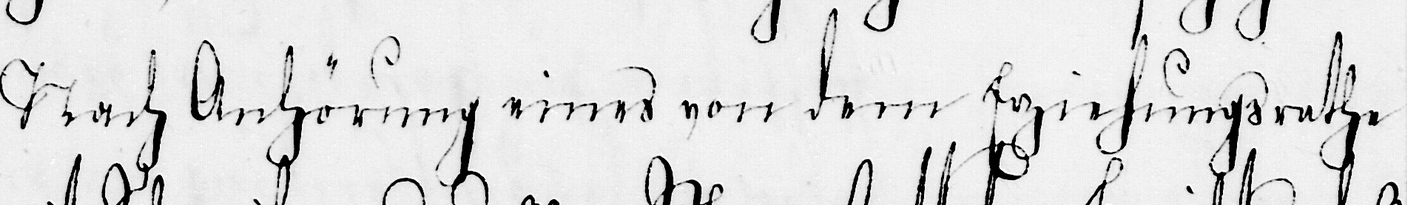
Nach Anhörung eines von dem Erziehungsrathe
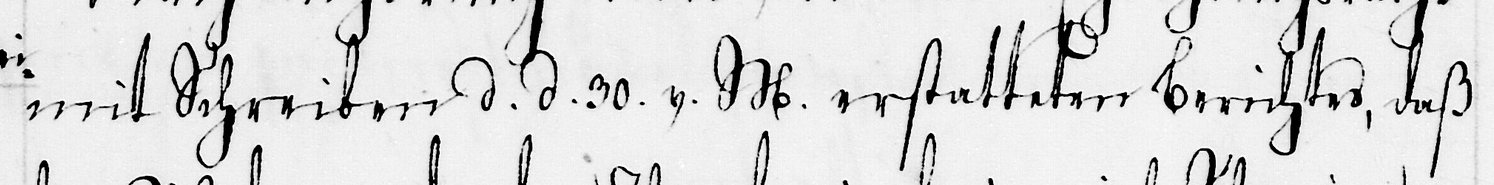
mit Schreiben d. d. 30. v. M. erstatteten Berichtes, daß
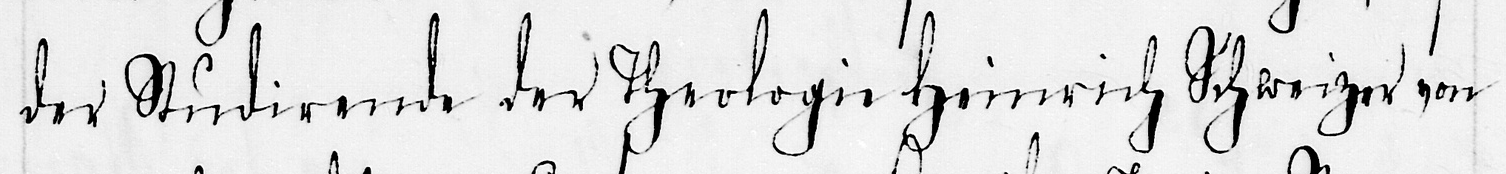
der Studirende der Theologie Heinrich Schweizer von
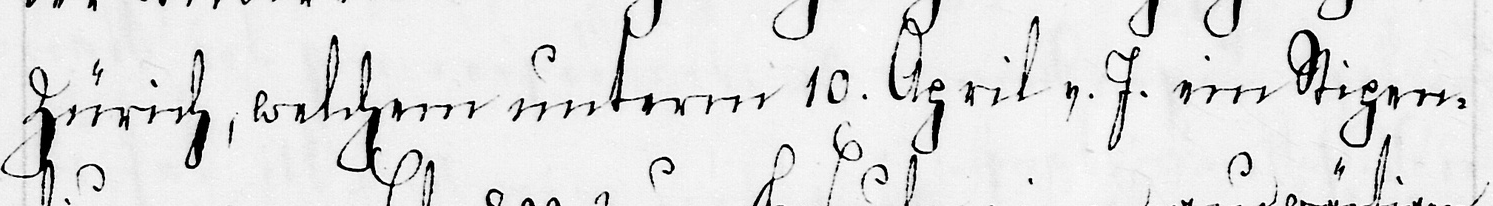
Zürich, welchem unterm 10. April v. J. ein Stipen¬
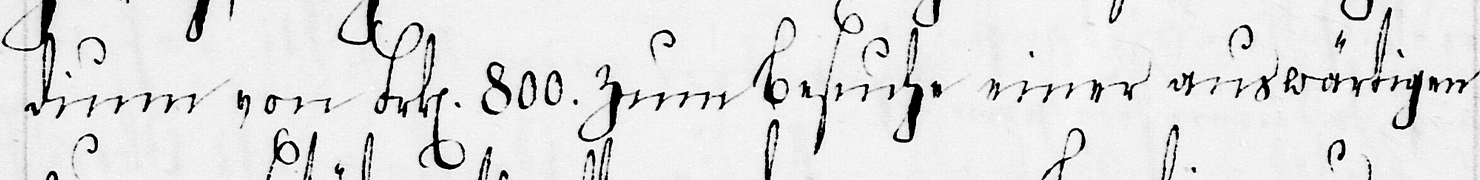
dium von Frk[en]. 800. zum Besuche einer auswärtigen
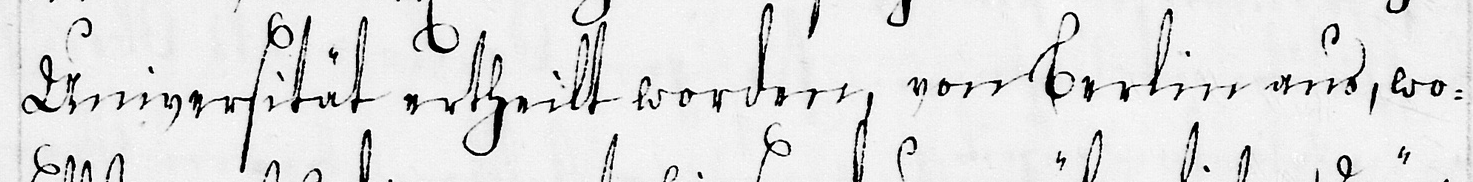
Universität ertheilt worden, von Berlin aus, wo¬
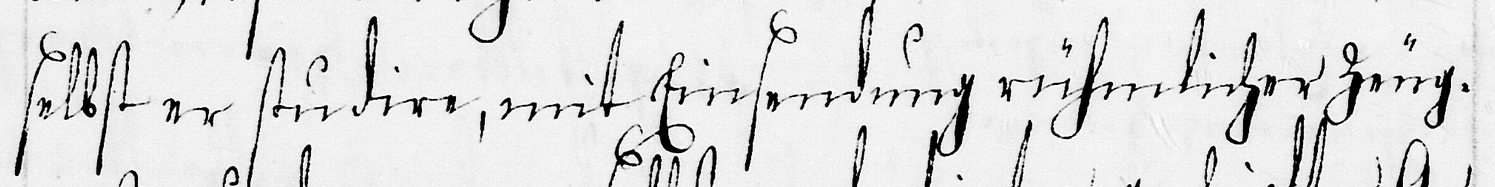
selbst er studire, mit Einsendung rühmlicher Zeug¬
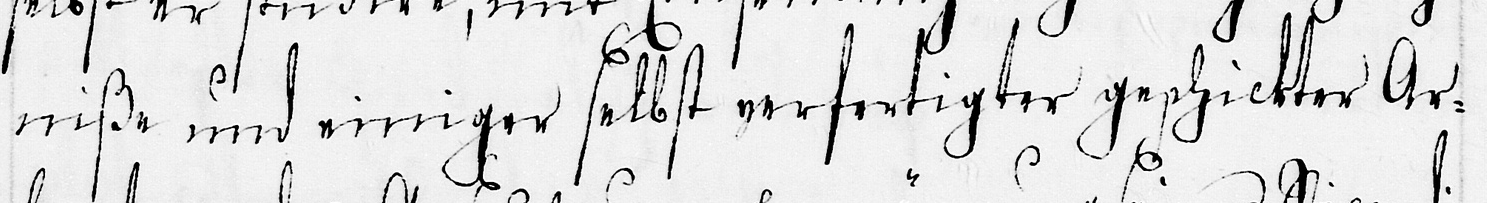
niße und einiger selbst verfertigter geschickter Ar¬
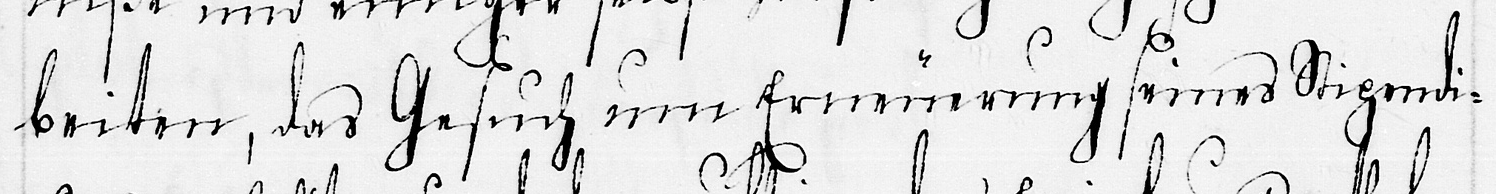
beiten, das Gesuch um Erneuerung seines Stipendi¬
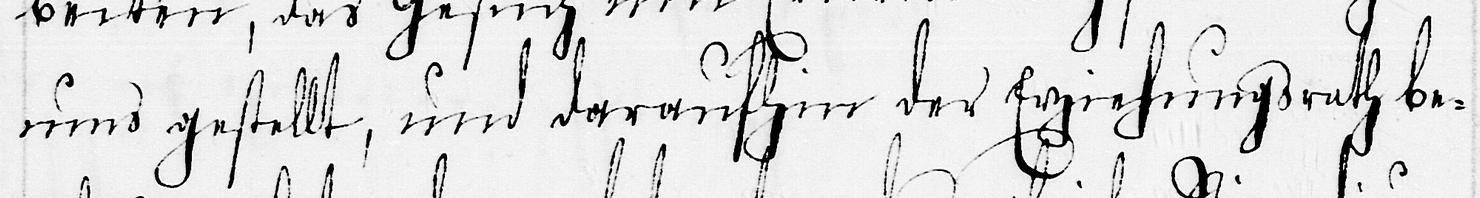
ums gestellt, und daraufhin der Erziehungsrath be¬
